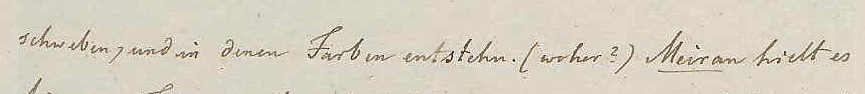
schweben, und in denen Farben entstehn. Meiran hielt es
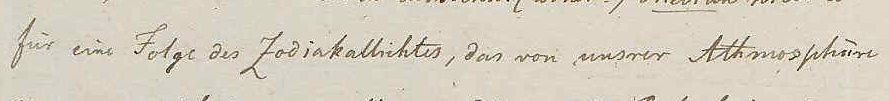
für eine Folge des Zodiakallichtes, das von unsrer Athmosphäre
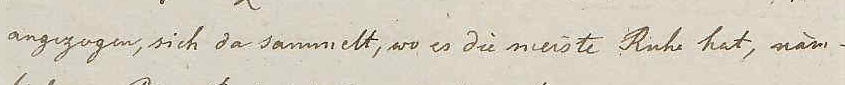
angezogen, sich da sammelt, wo es die meiste Ruhe hat, näm-
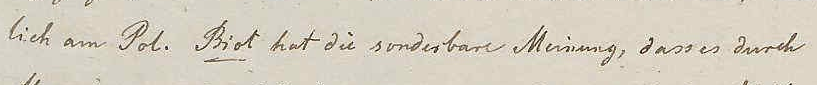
lich am Pol. Biot hat die sonderbare Meinung, dass es durch
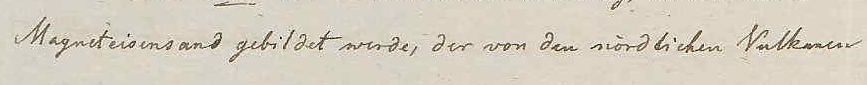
Magneteisensand gebildet werde, der von den nördlichen Vulkanen
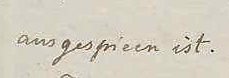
ausgespieen ist.
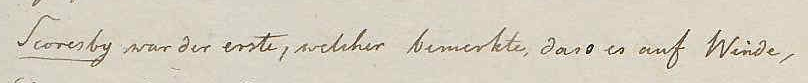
Scoresby war der erste, welcher bemerkte, dass es auf Winde,
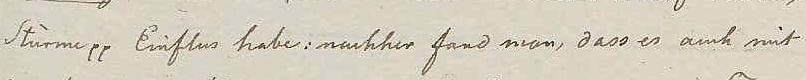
Stürme pp Einflus habe: nachher fand man, dass es auch mit
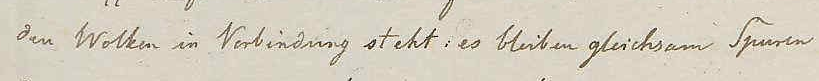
den Wolken in Verbindung steht: es bleiben gleichsam Spuren
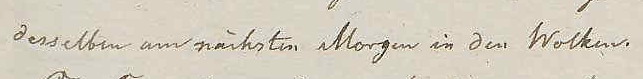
desselben am nächsten Morgen in den Wolken.
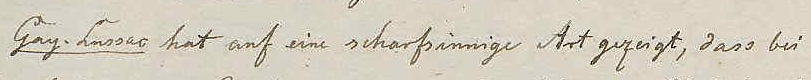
Gay-Lussac hat auf eine scharfsinnige Art gezeigt, dass bei
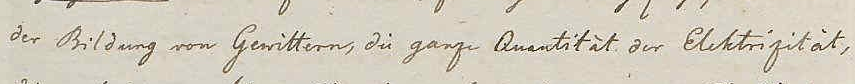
der Bildung von Gewittern, die ganze Quantität der Elektrizität,
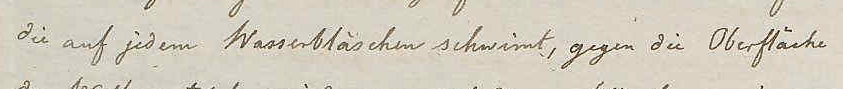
die auf jedem Wasserbläschen schwimt, gegen die Oberfläche
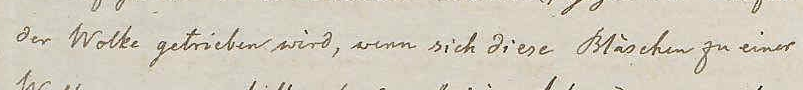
der Wolke getrieben wird, wenn sich diese Bläschen zu einer
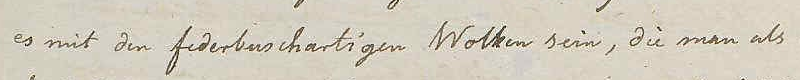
es mit den federbuschartigen Wolken sein, die man als
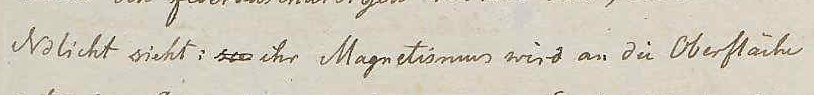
Ndlicht sieht: sieihr Magnetismus wird an die Oberfläche
